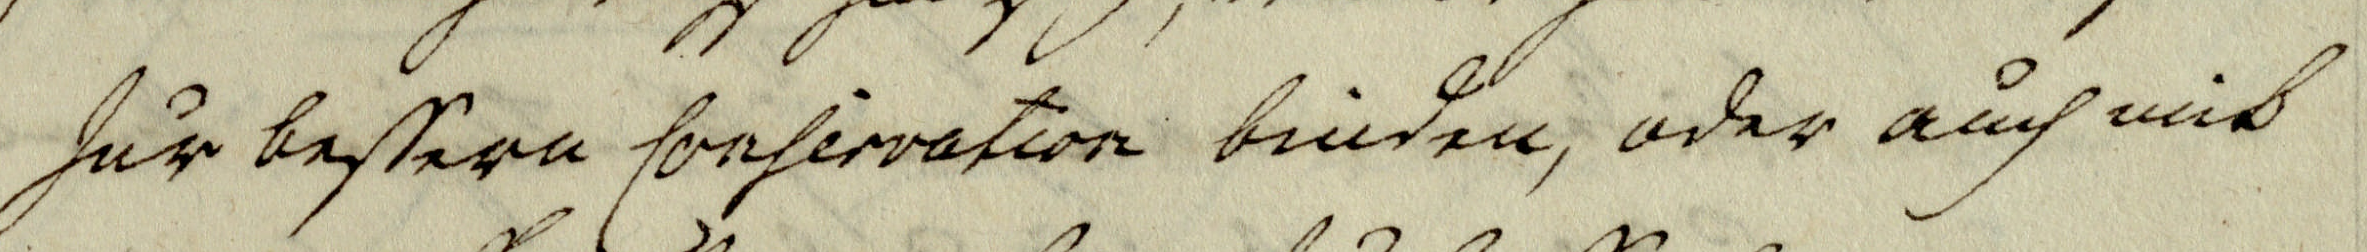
zur bessern Conservation binden, oder auch mit
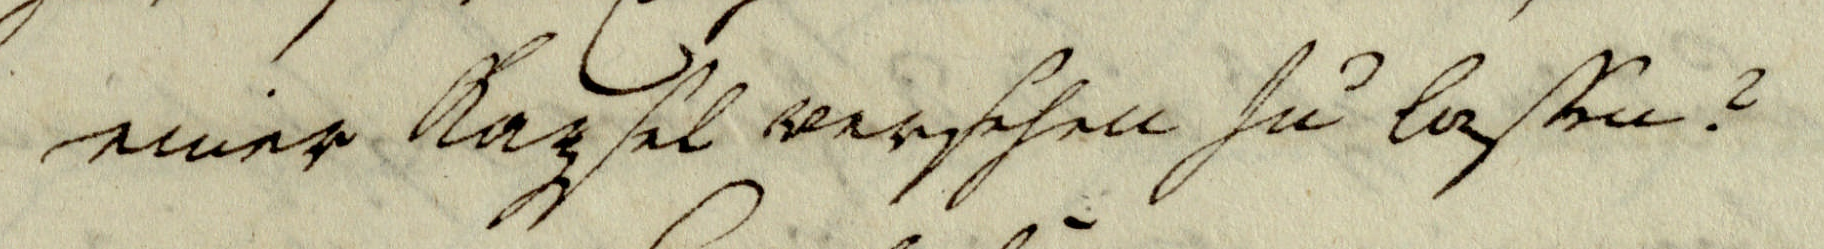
einer Kapsel versehen zu lassen?
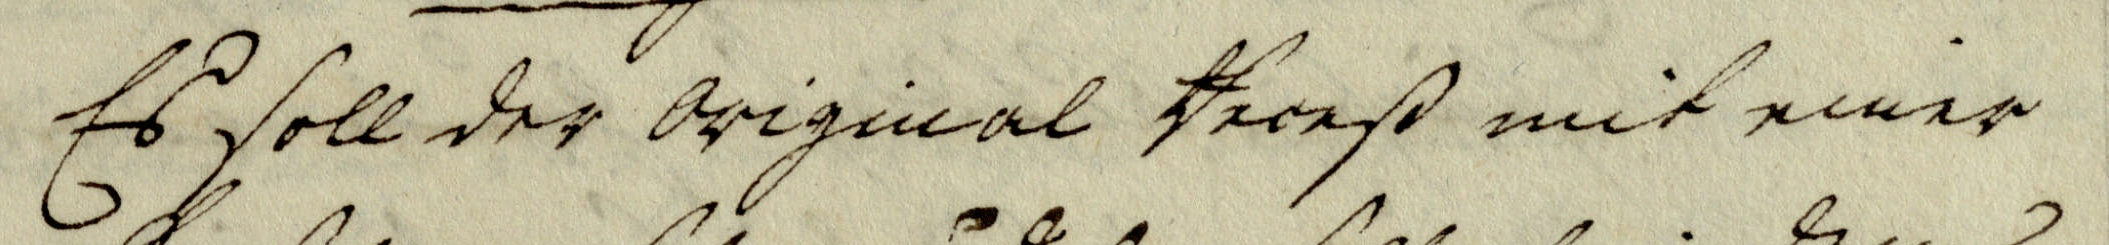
Es soll der Original Receß mit einer
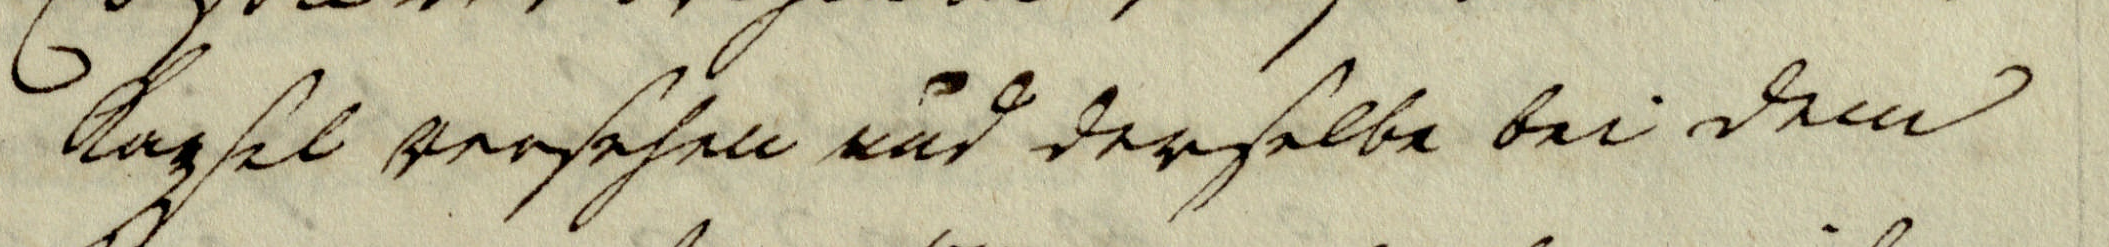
Kapsel versehen und derselbe bei dem
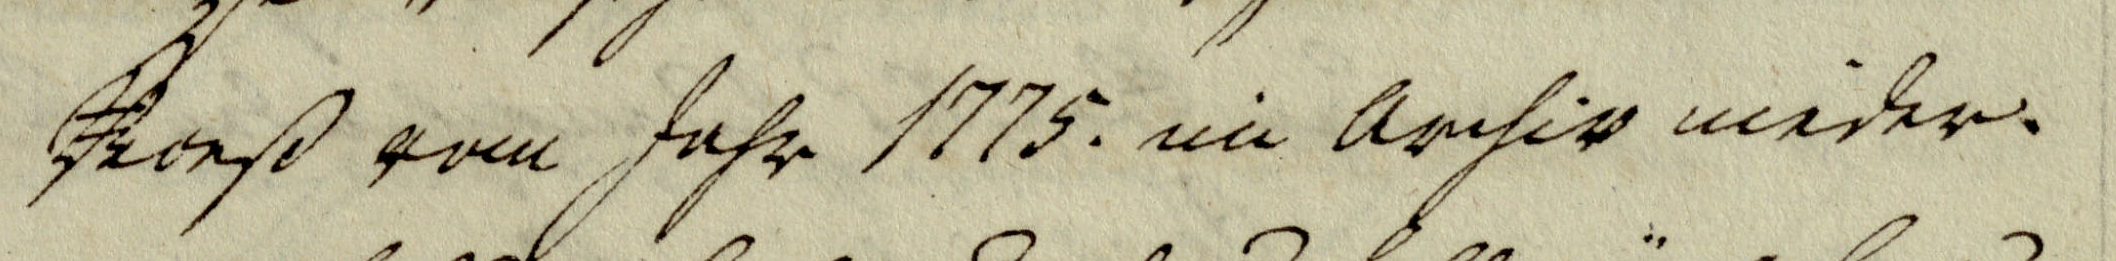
Receß vom Jahr 1775. in Archiv nieder¬
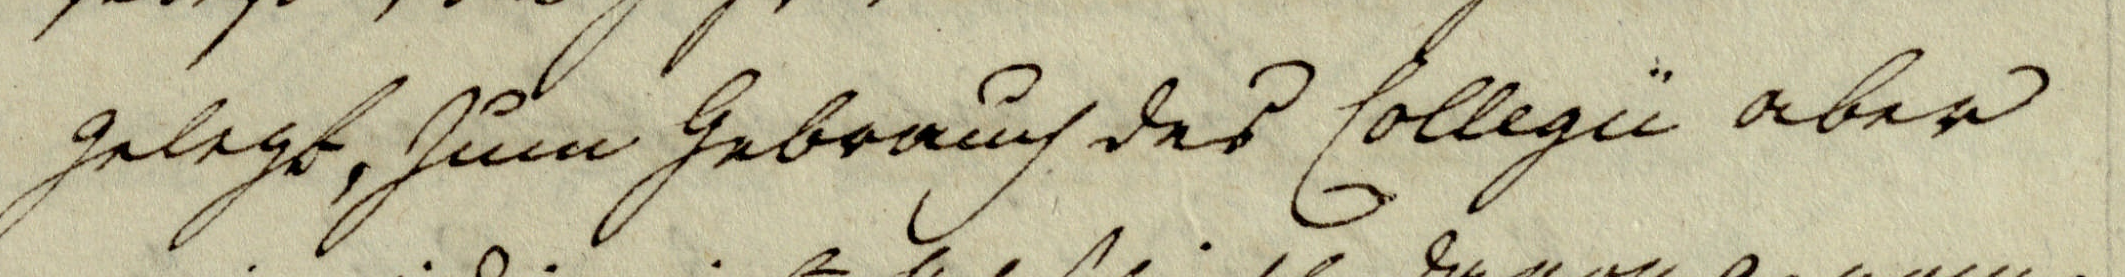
gelegt, zum Gebrauch des Collegii aber
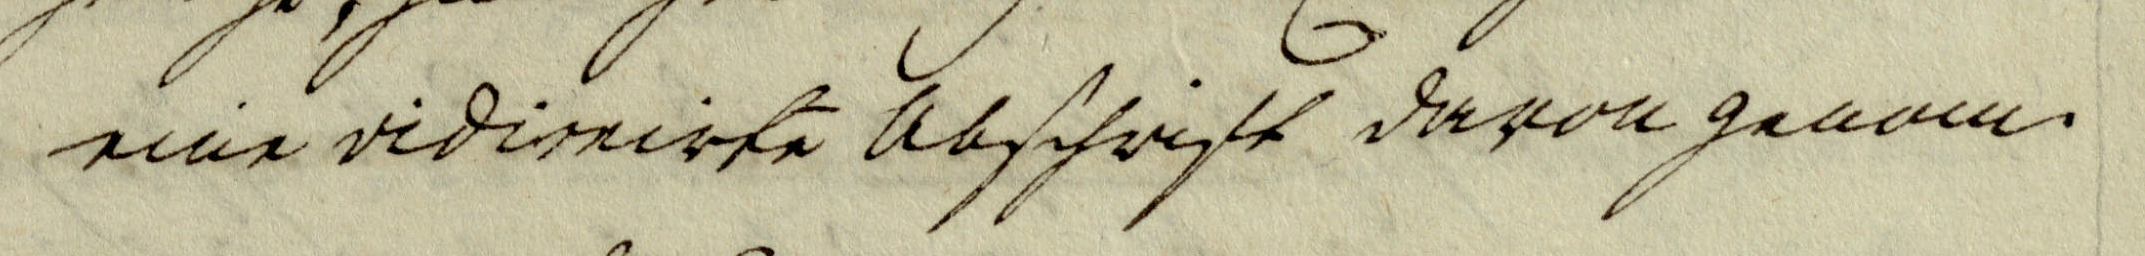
eine vidimirte Abschrift davon genom¬
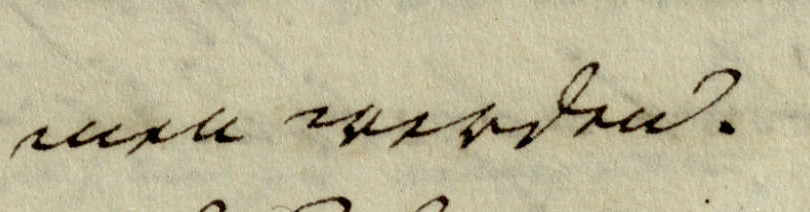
men werden.
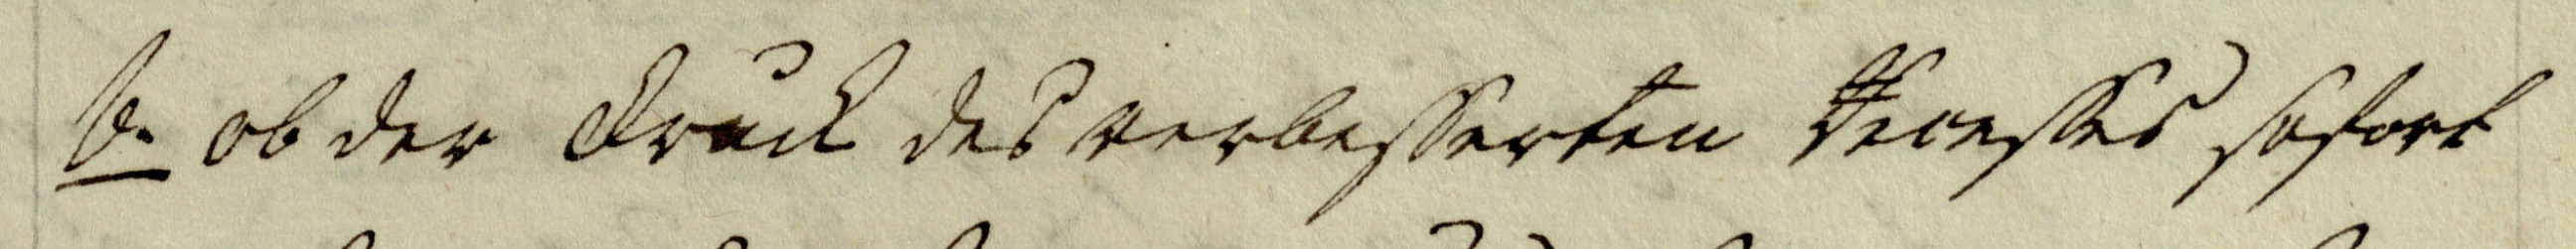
b. ob der Druck des verbesserten Recesses sofort
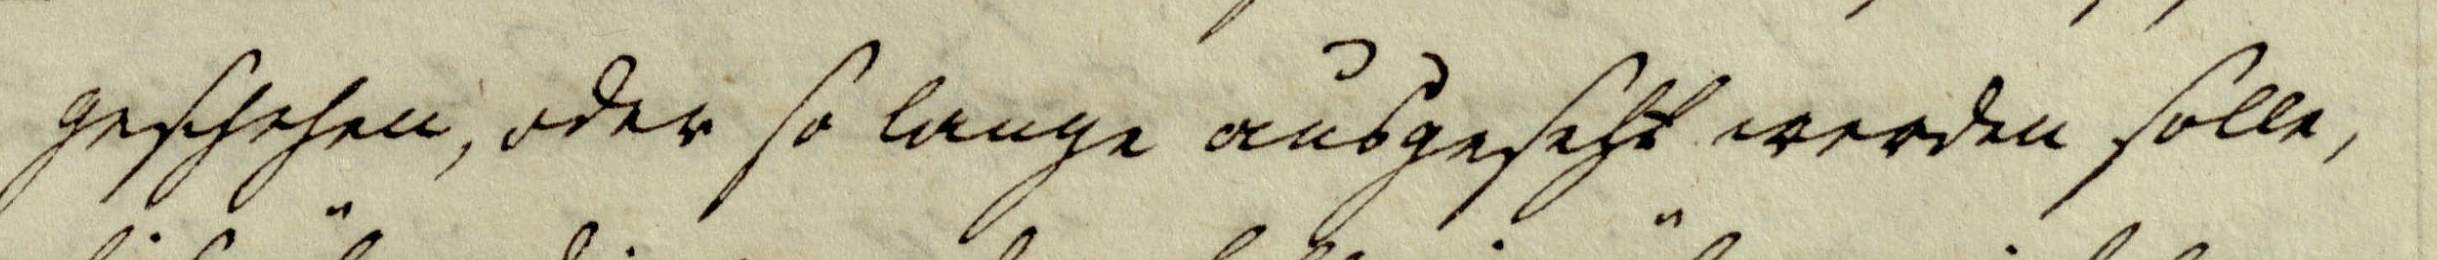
geschehen, oder so lange ausgesetzt werden solle,
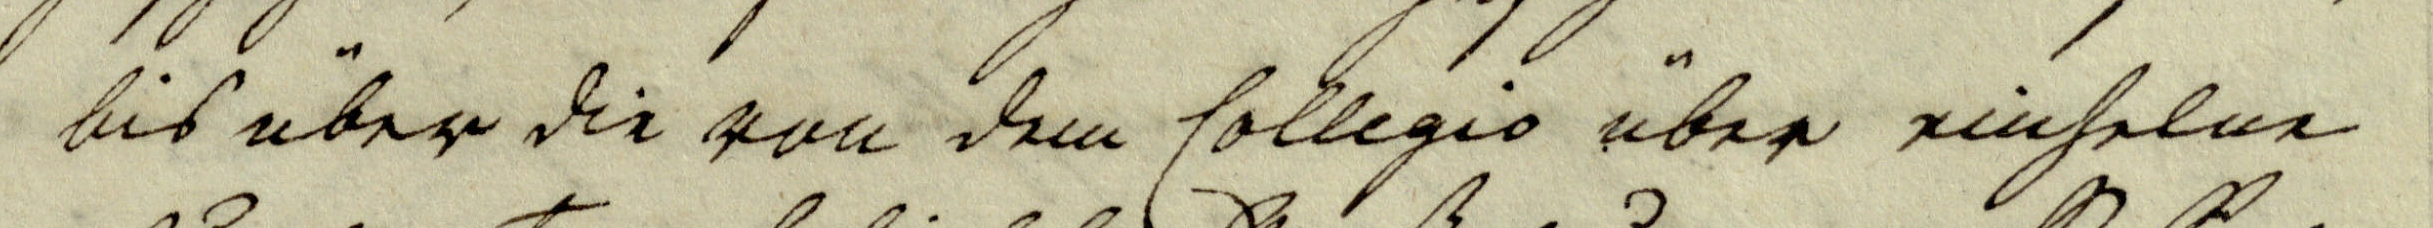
bis über die von dem Collegio über einzelne
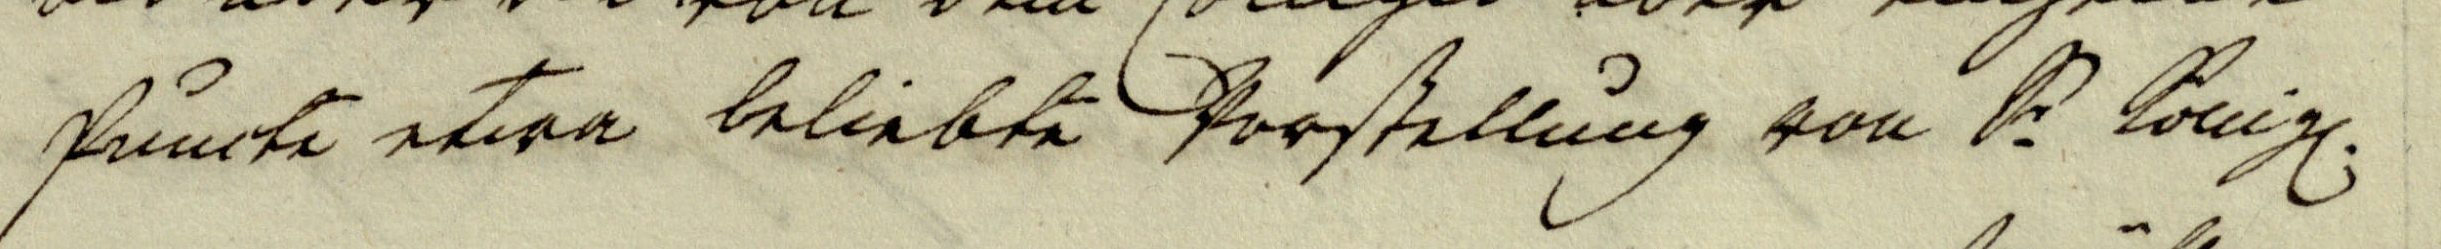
Puncte etwa beliebte Vorstellung von Sr Königl.
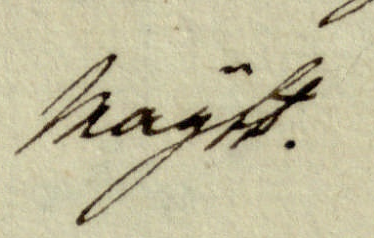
Maÿtt.
